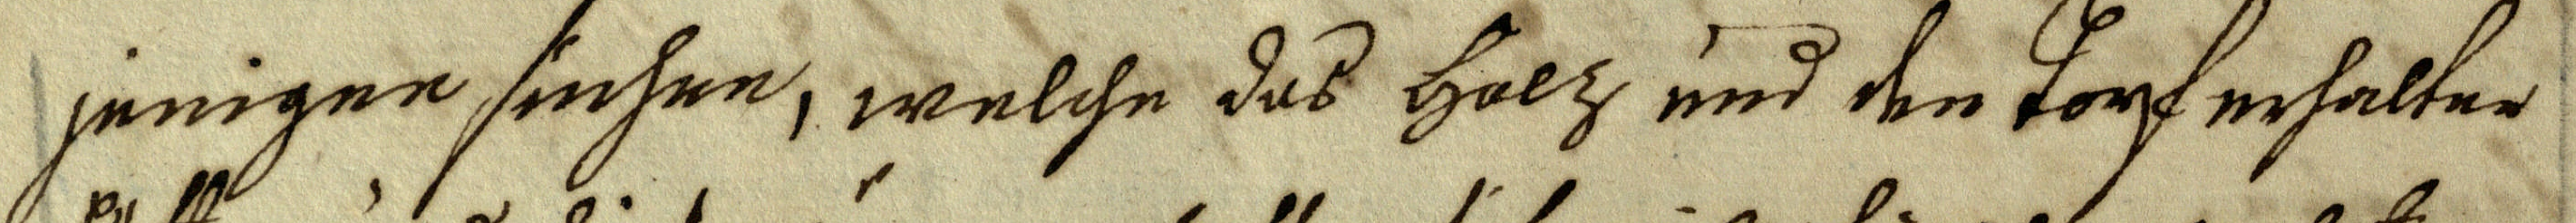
jenigen suchen, welche das Holz und den Torf erhalten
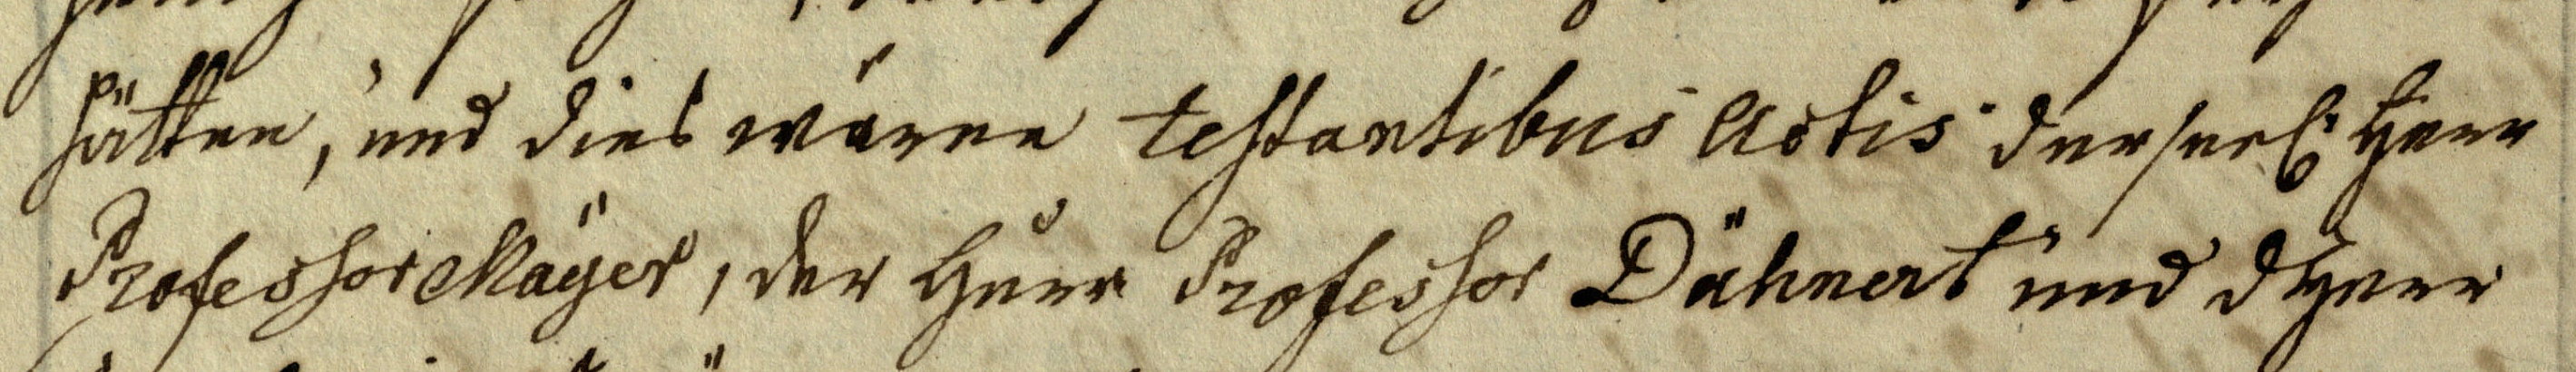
hätten, und dies wären testantibus actis der seel. Herr
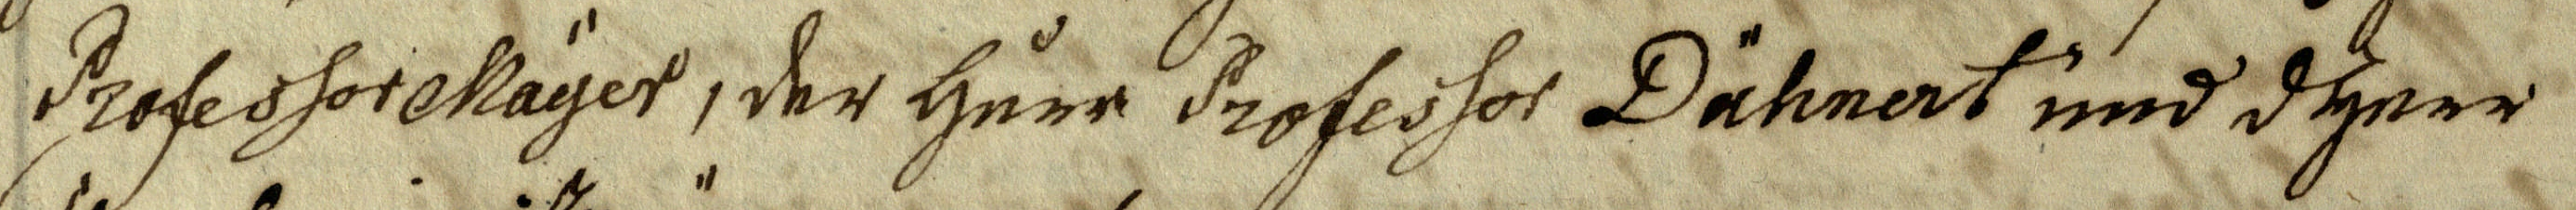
Professor Maÿer, der Herr Professor Dähnert und dHerr
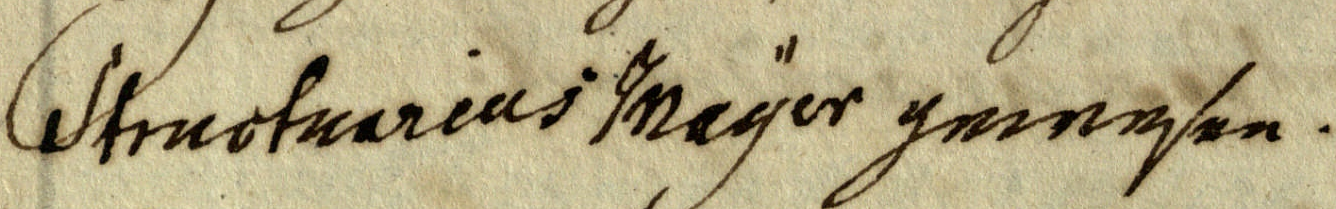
Structuarius Maÿer gewesen.
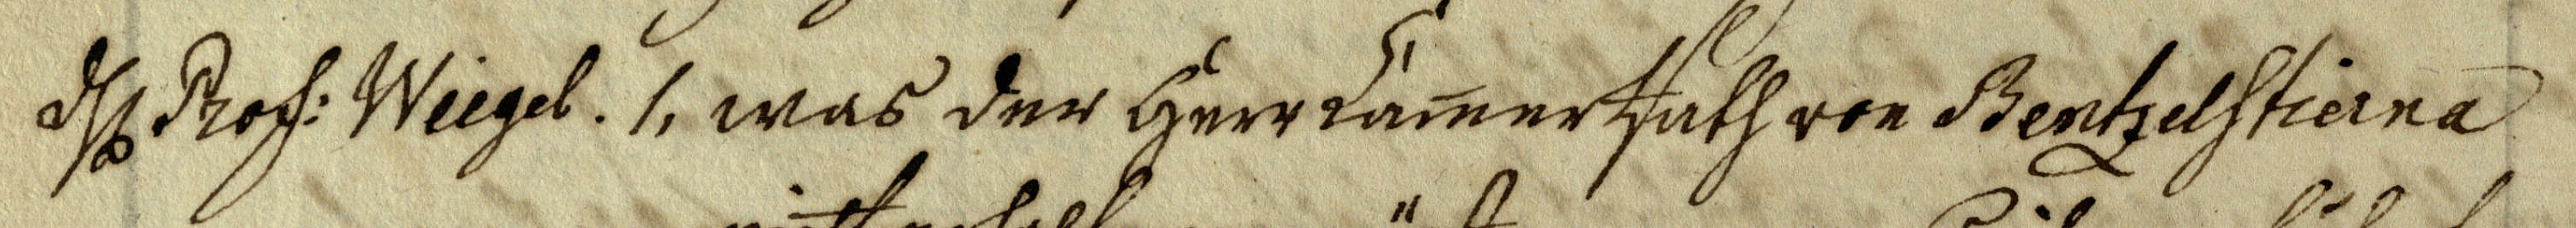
dh. Prof. Weigel. 1. was der Herr CamerRath von Bentzelstierna
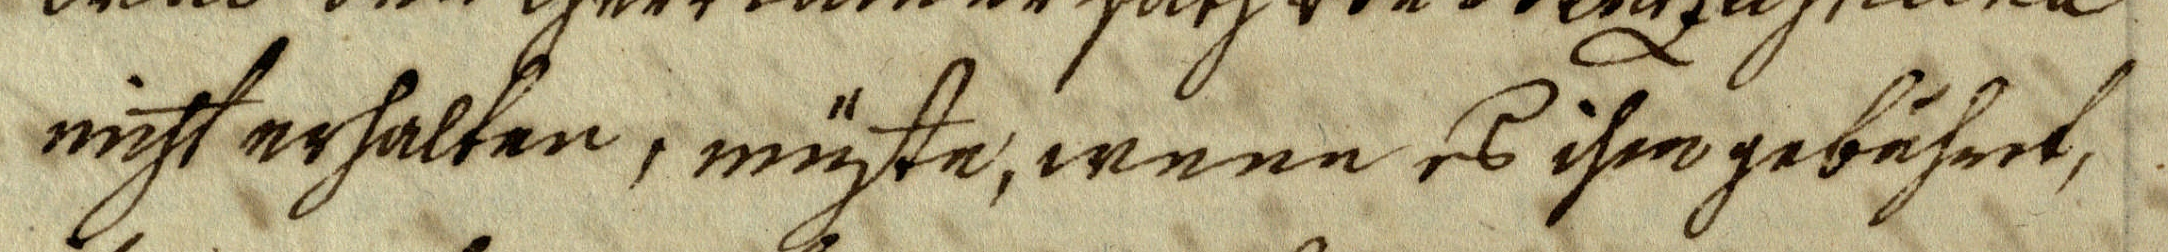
nicht erhalten, müßte, wenn es ihm gebühret,
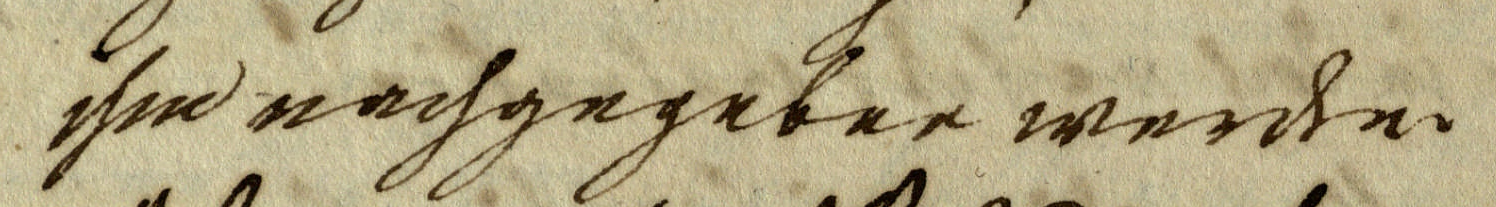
ihm nachgegeben werden.
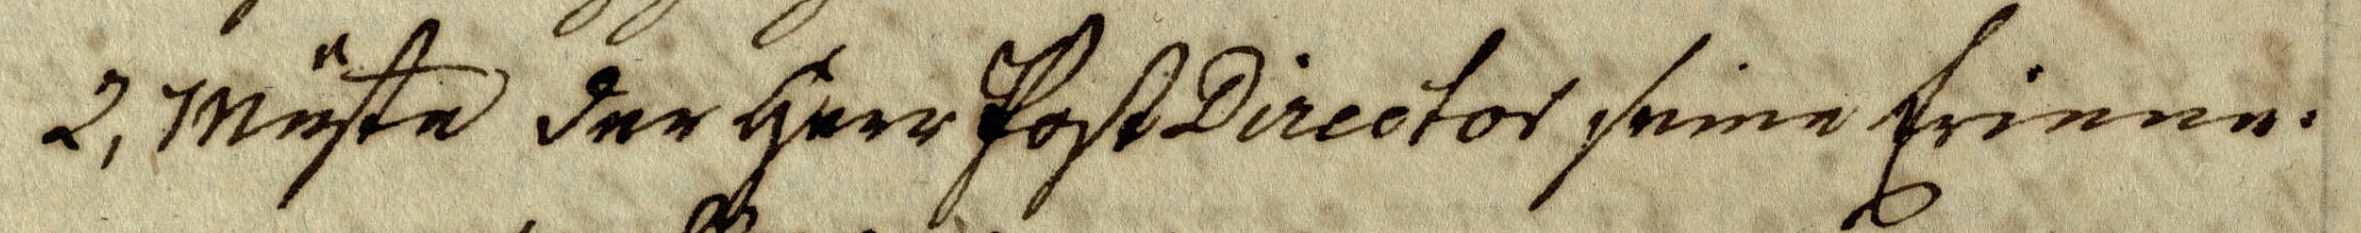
2. Müßte der Herr PostDirector seine Erinne¬
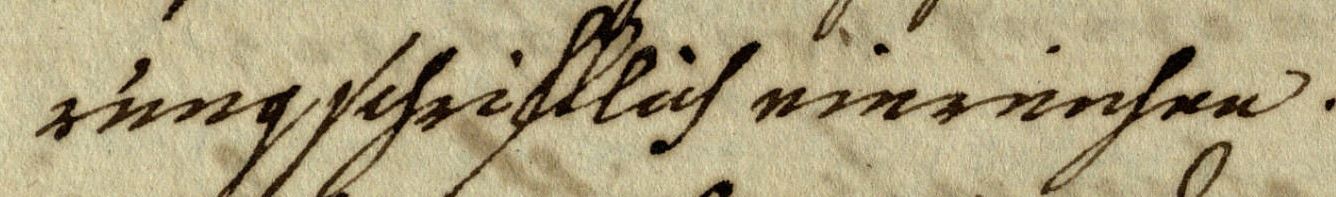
rung schriftlich einreichen.
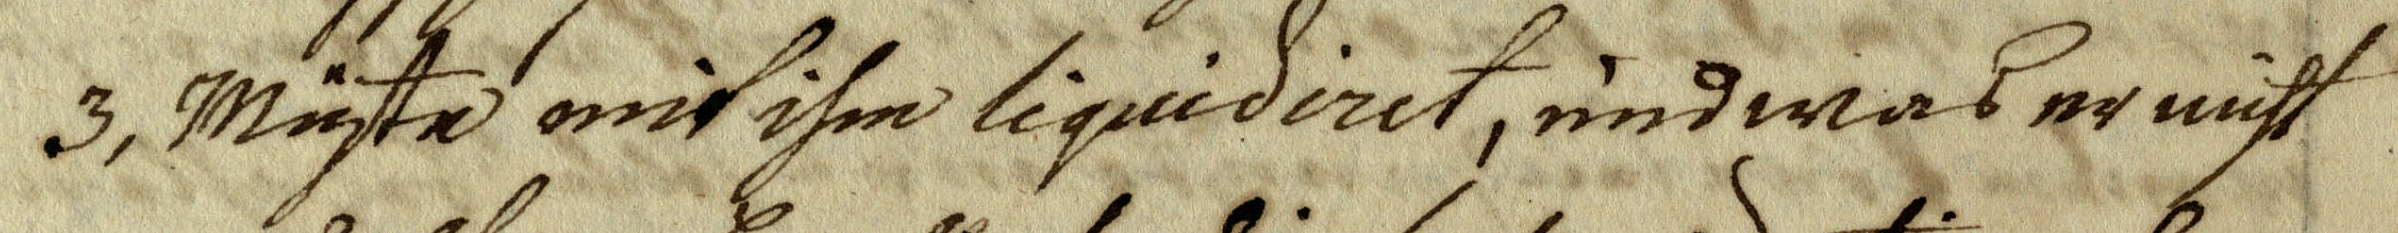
3. Müßte mit ihm liquidiret, und was er nicht
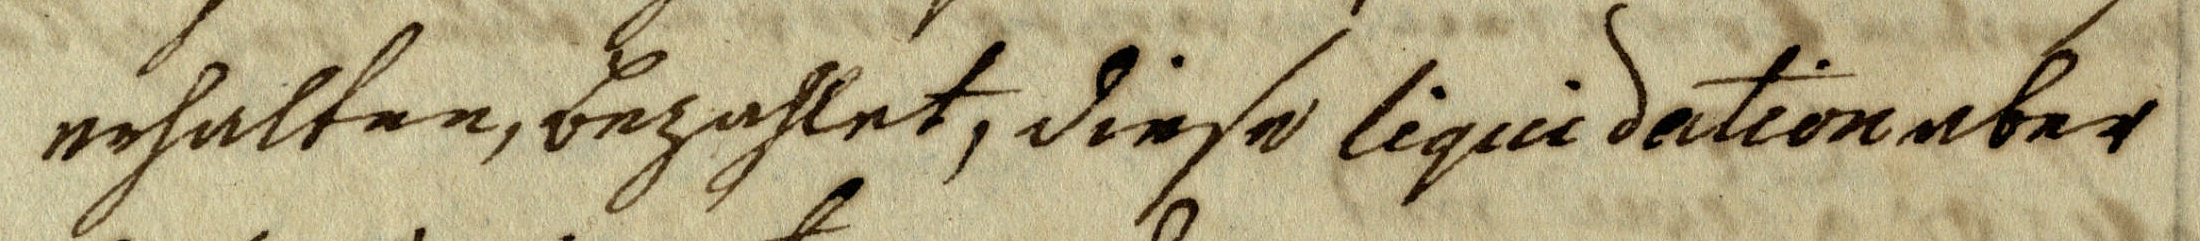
erhalten, bezahlet, diese liquidation aber
